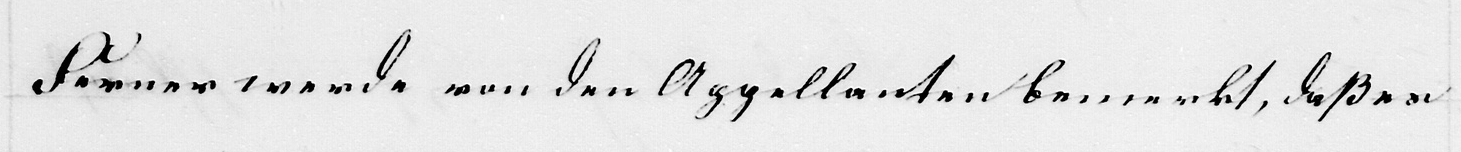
Ferner werde von den Appellanten bemerkt, daß es
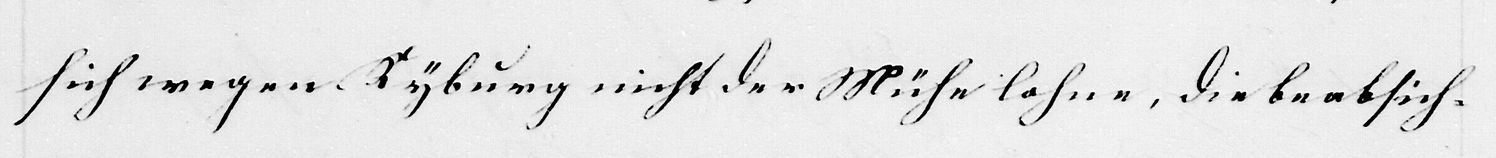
sich wegen Kyburg nicht der Mühe lohne, die beabsich¬
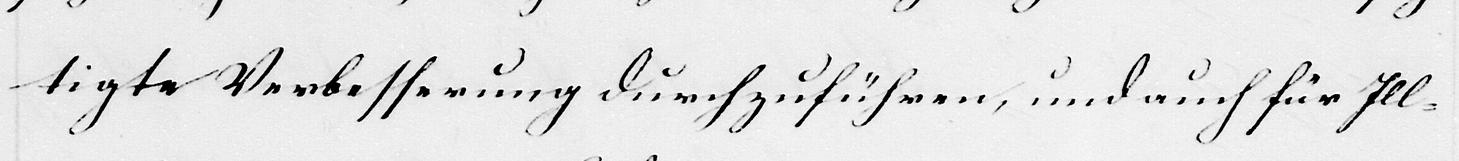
tigte Verbesserung durchzuführen, und auch für Ill¬
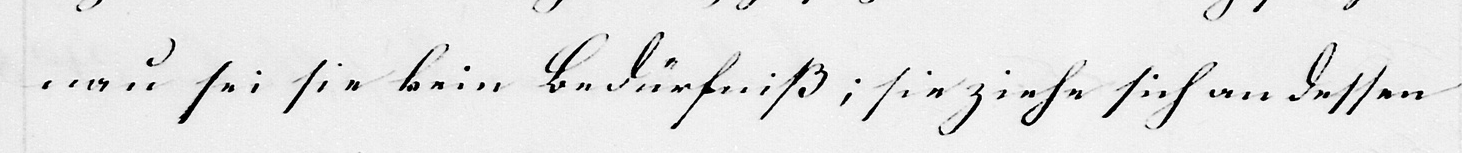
nau sei sie kein Bedürfniß; sie ziehe sich an dessen
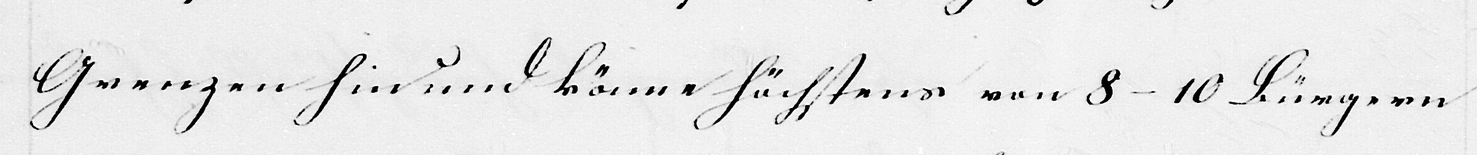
Grenzen hin und könne höchstens von 8−10 Bürgern
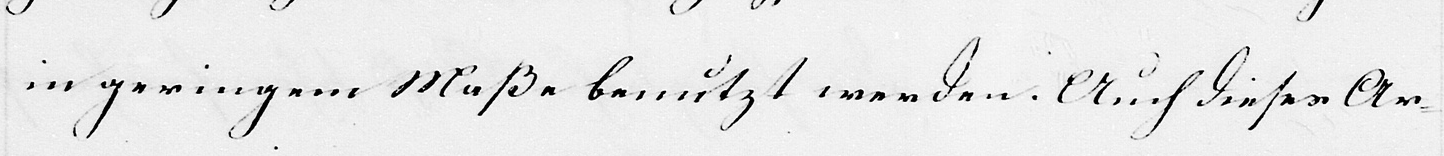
in geringem Maße benutzt werden. Auch dieses Ar¬
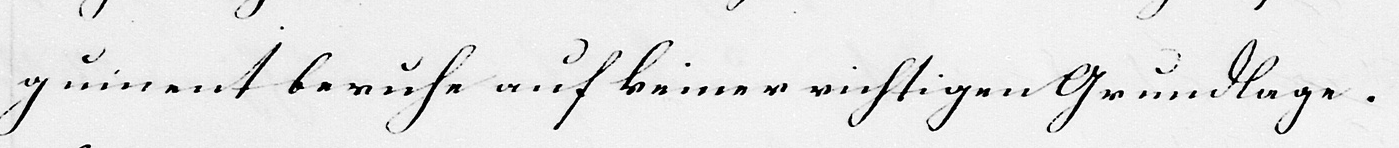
gument beruhe auf keiner richtigen Grundlage.
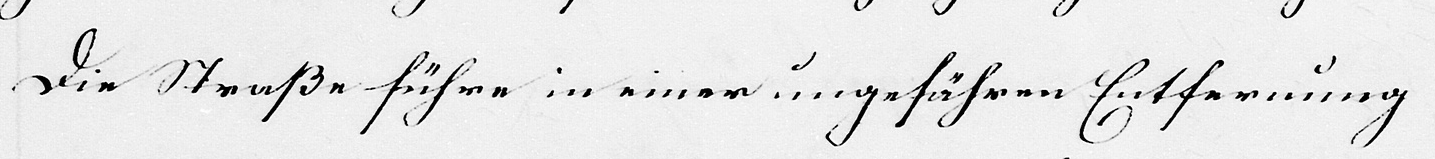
Die Straße führe in einer ungefähren Entfernung
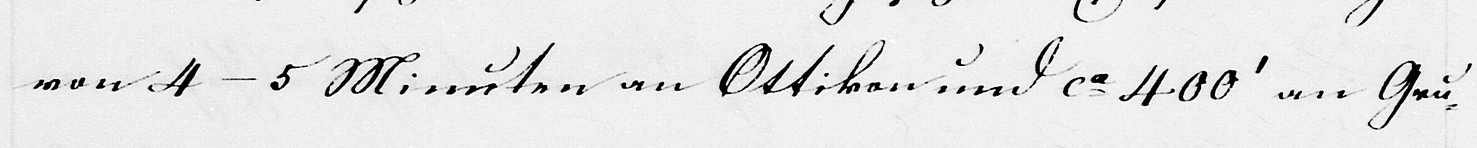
von 4−5 Minuten an Ottikon und ca 400 [Fuss] an Gru¬
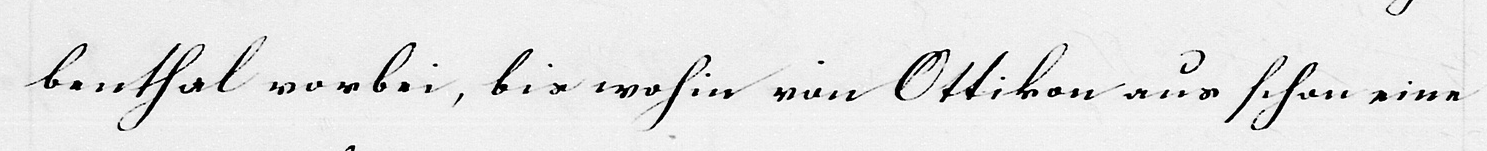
benthal vorbei, bis wohin von Ottikon aus schon eine
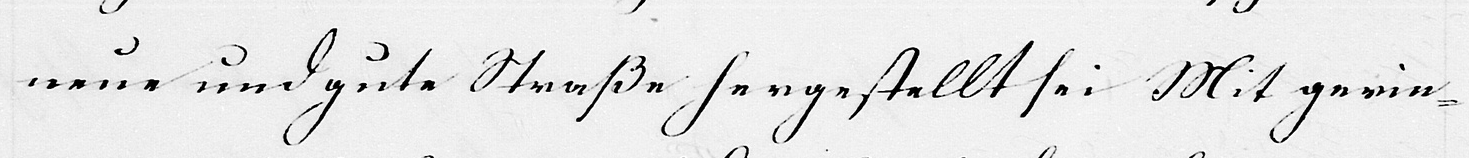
neue und gute Straße hergestellt sei[.] Mit gerin¬
